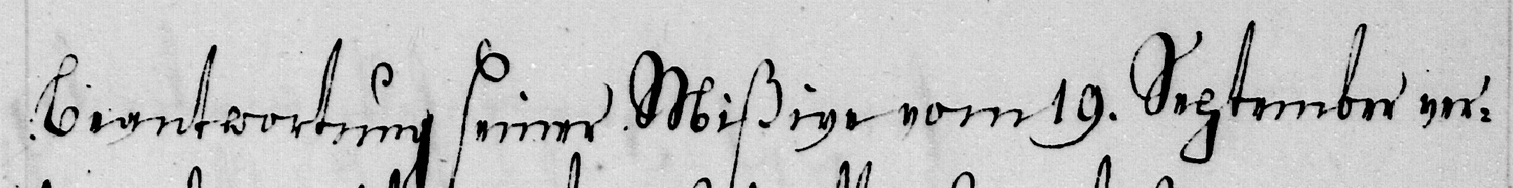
Beantwortung seiner Mißive vom 19. September ver¬
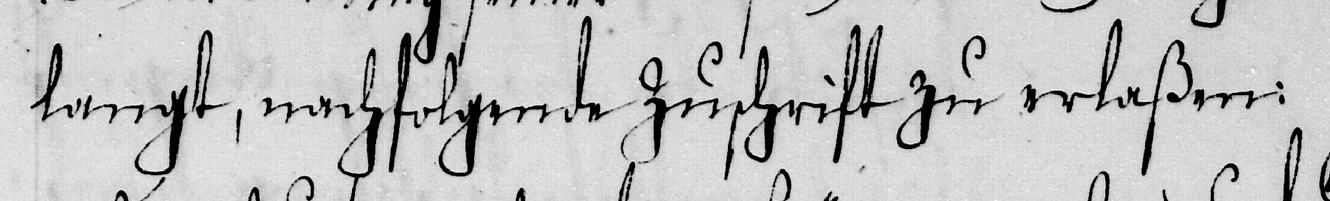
langt, nachfolgende Zuschrift zu erlaßen:
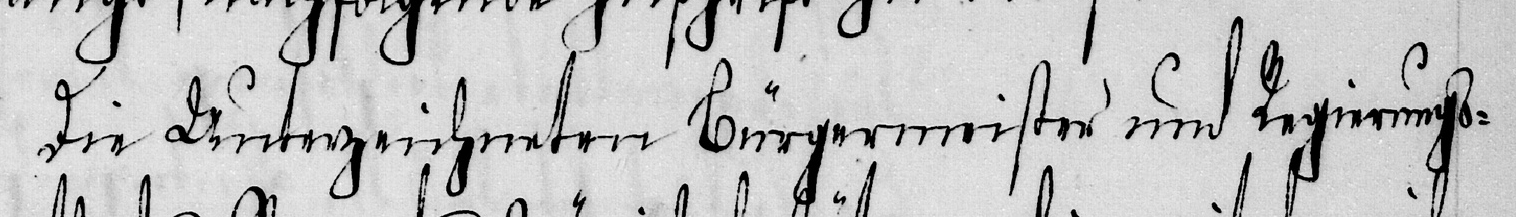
Die Unterzeichneten Bürgermeister und Regierungs¬
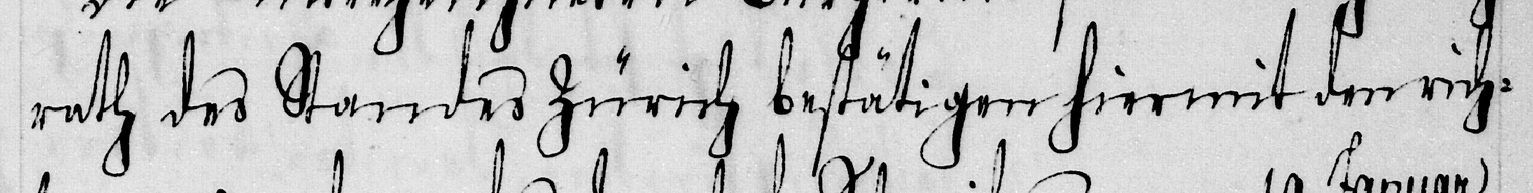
rath des Standes Zürich bestätigen hiermit den rich¬
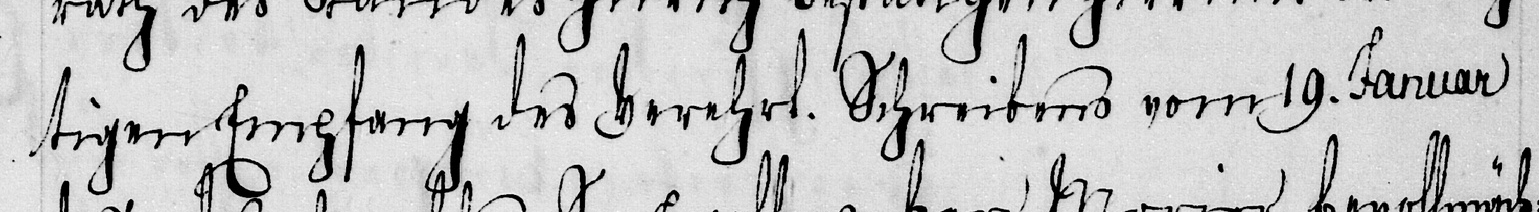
tigen Empfang des Verehrl. Schreibens vom 19. Januar
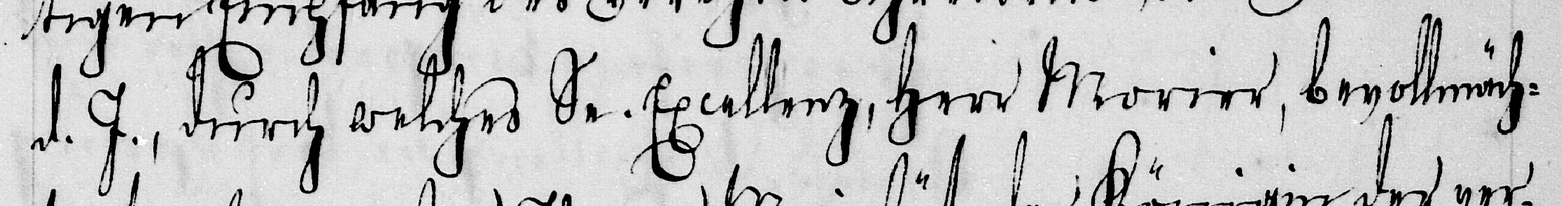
d. J., durch welches Sn. Excellenz, Herr Morier, bevollmäch¬
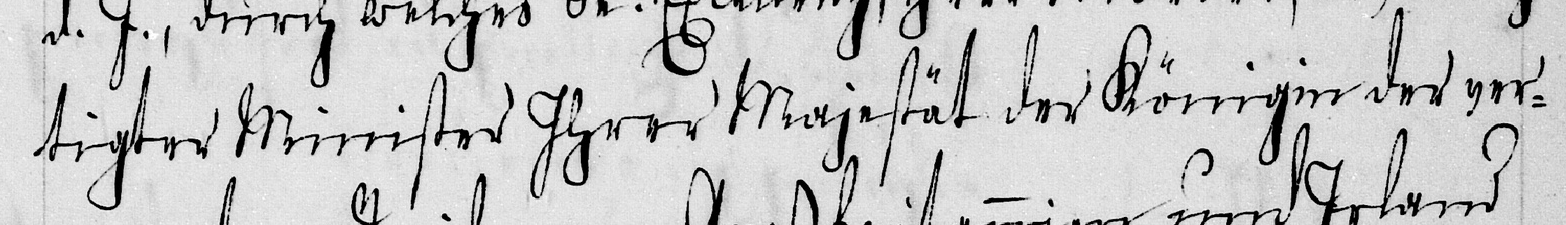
tigter Minister Ihrer Majestät der Königin der ver¬
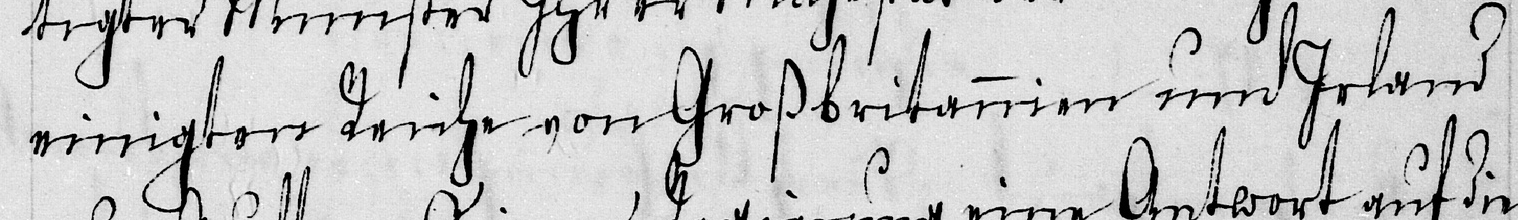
einigten Reiche von Großbritannien und Irland
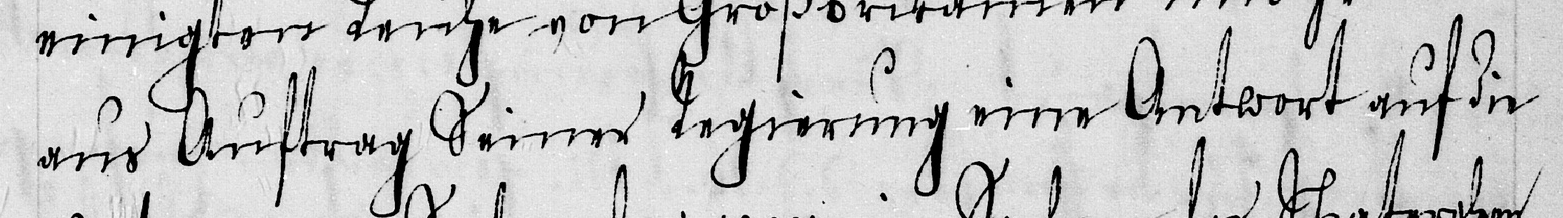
aus Auftrag Seiner Regierung eine Antwort auf die
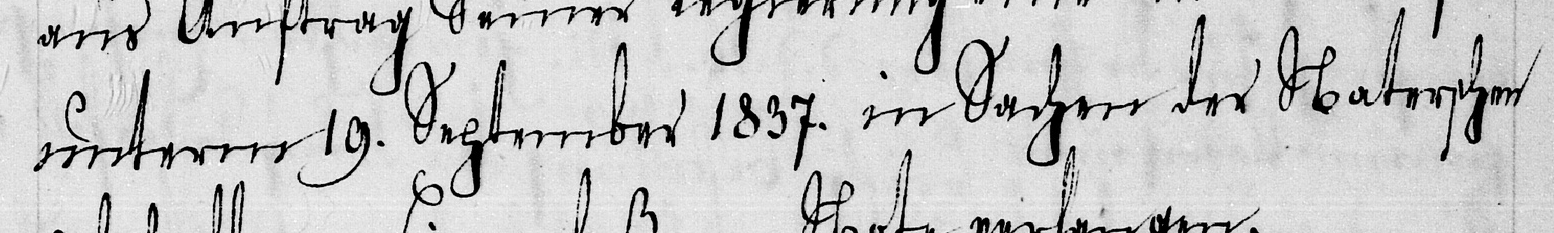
unterm 19. September 1837. in Sachen der Materschen
